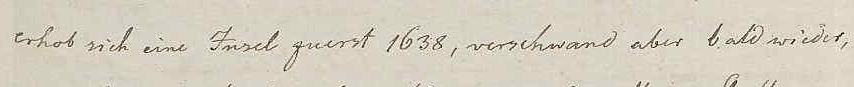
erhob sich eine Insel zuerst 1638, verschwand aber bald wieder,
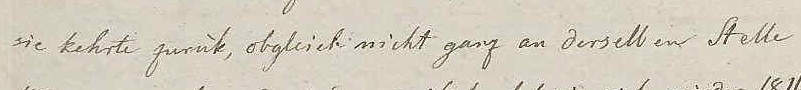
sie kehrte zurük, obgleich nicht ganz an derselben Stelle
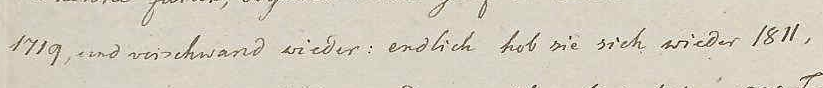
1719, und verschwand wieder: endlich hob sie sich wieder 1811,
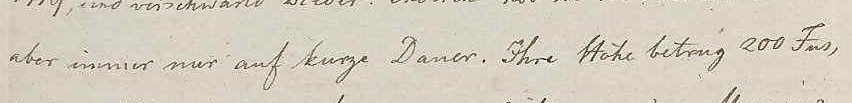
aber immer nur auf kurze Dauer. Ihre Höhe betrug 200 Fus,
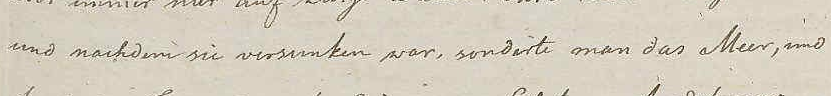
und nachdem sie versunken war, sondirte man das Meer, und
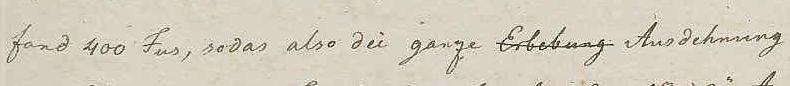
fand 400 Fus, sodas also die ganze ErbebungAusdehnung
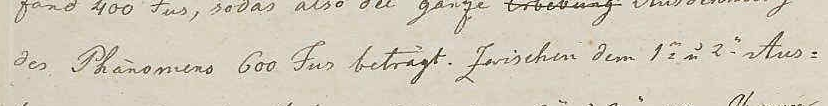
des Phänomens 600 Fus beträgt. Zwischen dem 1￼ u 2￼ Aus-
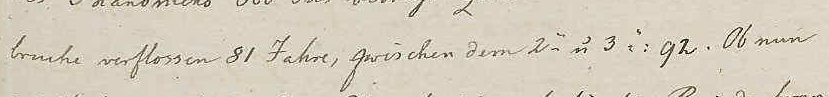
bruche verflossen 81 Jahre, zwischen dem 2￼ u 3￼: 92. Ob nun
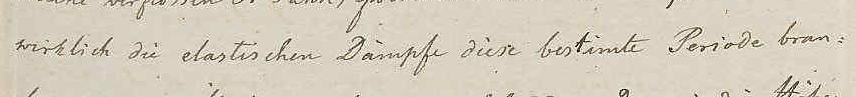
wirklich die elastischen Dämpfe diese bestimte Periode brau-
